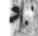又
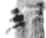三
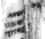三
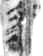赤
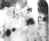二
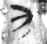方
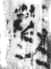顔首
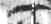一
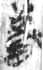○（巂）
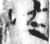廿
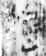檐（擔）
